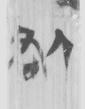咎
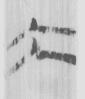大
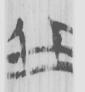但
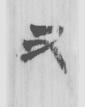又
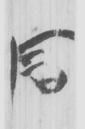石
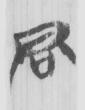君
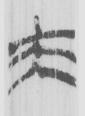夫
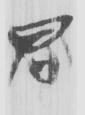君
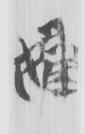婦
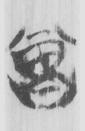曾
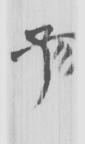孫
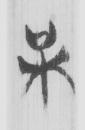某
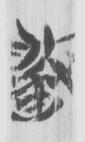敢
